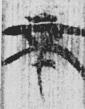不
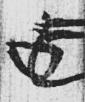𠁩
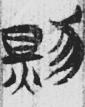則
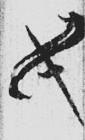民
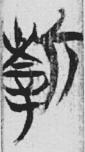新（親）
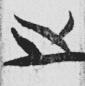之
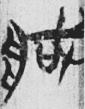○（莊）
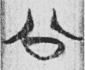公
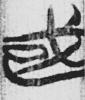或（又）
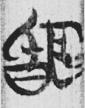䎽（問）
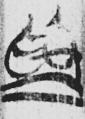爲
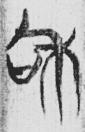和
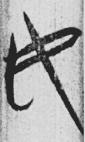女（如）
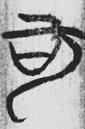可（何）
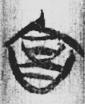合
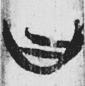曰
